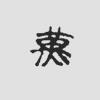黃
